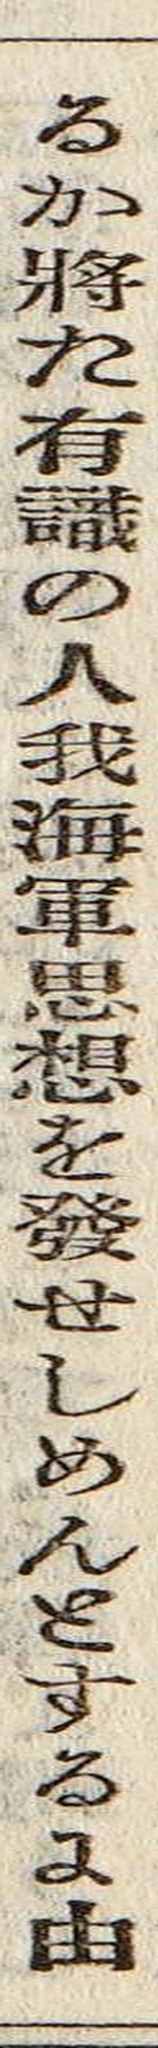るか将た有識の人我海軍思想を発せしめんとするに由
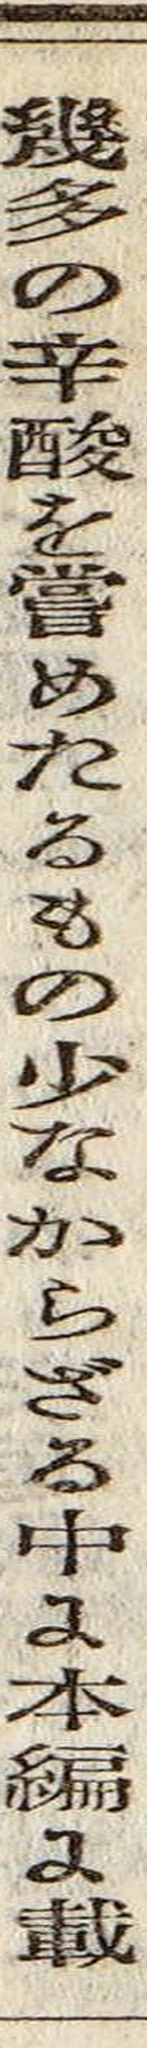幾多の辛酸を嘗めたるもの少なからざる中に本編に載
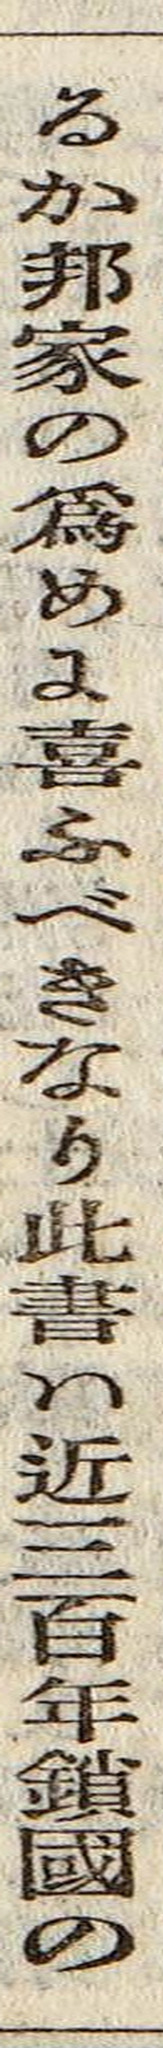るか邦家の為めに喜ふべきなり此書は近三百年鎖国の
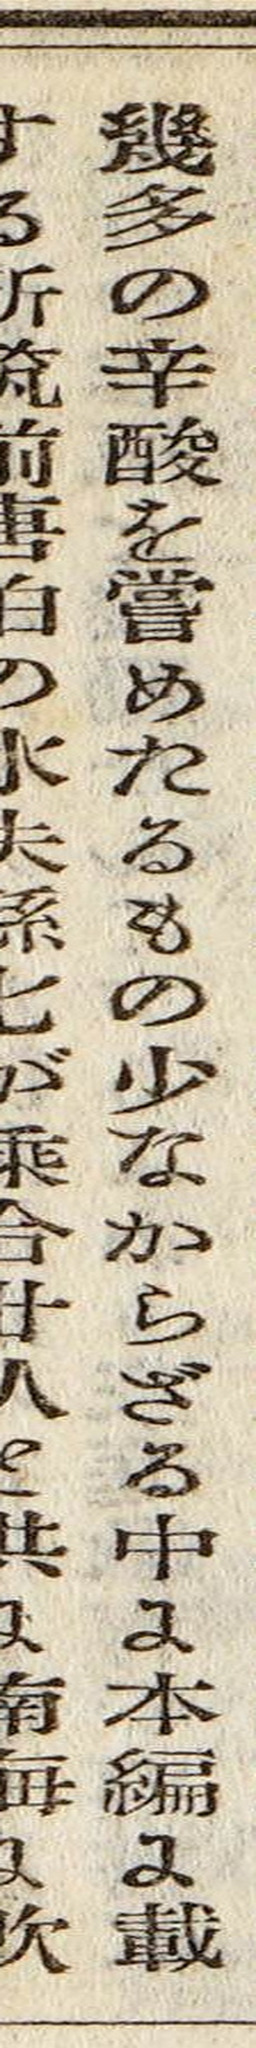する所筑前唐泊の水夫孫七が乗合廿人と共に南海に吹
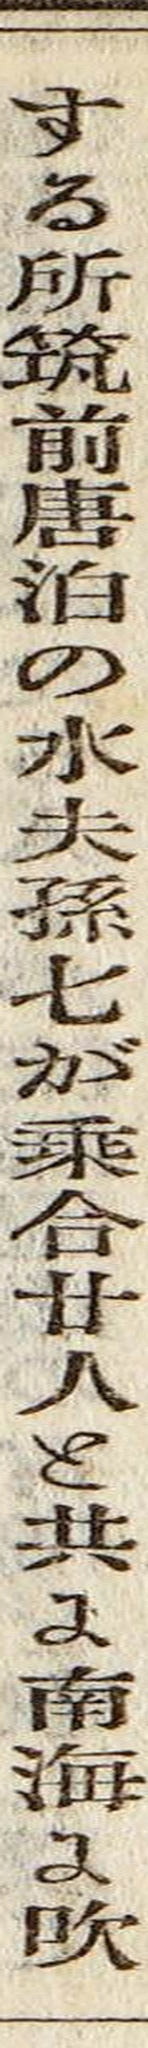する所筑前唐泊の水夫孫七が乗合廿人と共に南海に吹
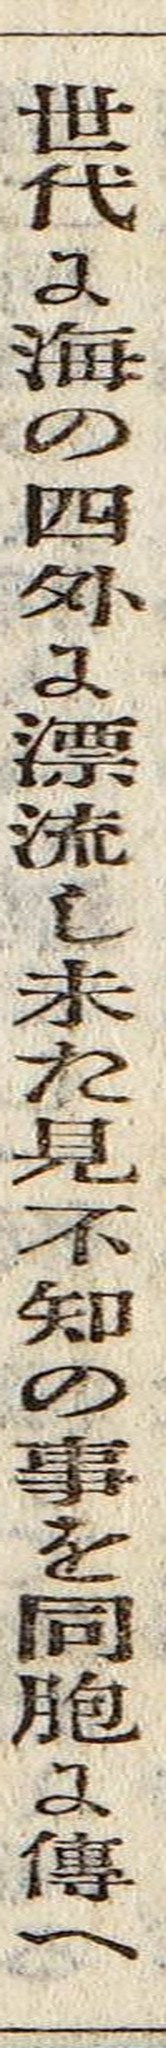世代に海の四外に漂流し未た見不知の事を同胞に伝へ
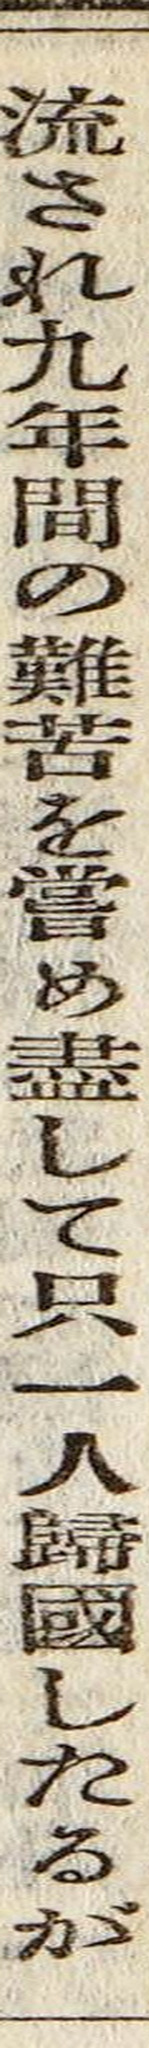流され九年間の難苦を嘗め尽して只一人帰国したるが
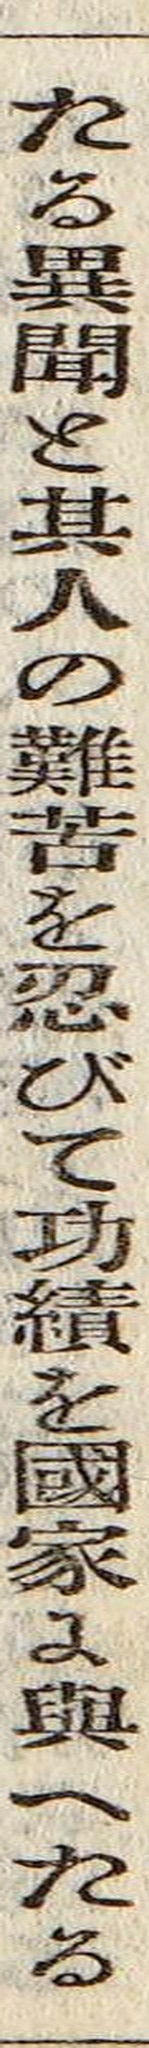たる異聞と其人の難苦を忍びて功績を国家に与へたる
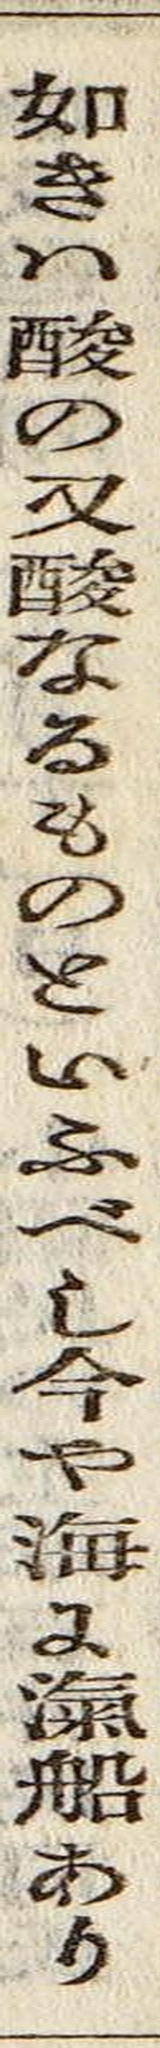如きは酸の又酸なるものといふべし今や海に汽船あり
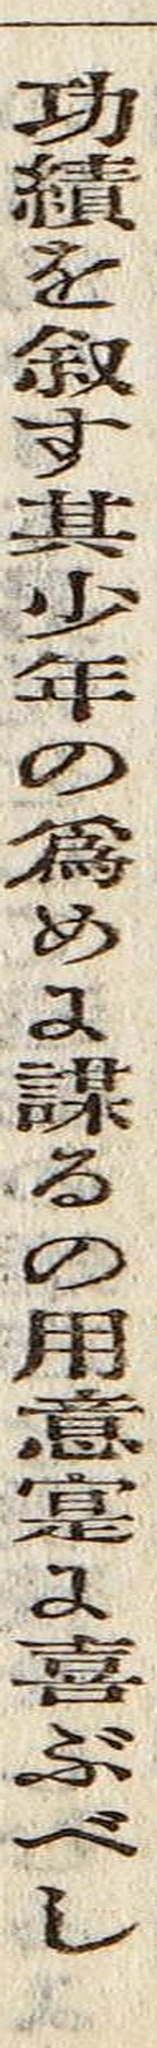功績を叙す其少年の為めに謀るの用意寔に喜ぶべし
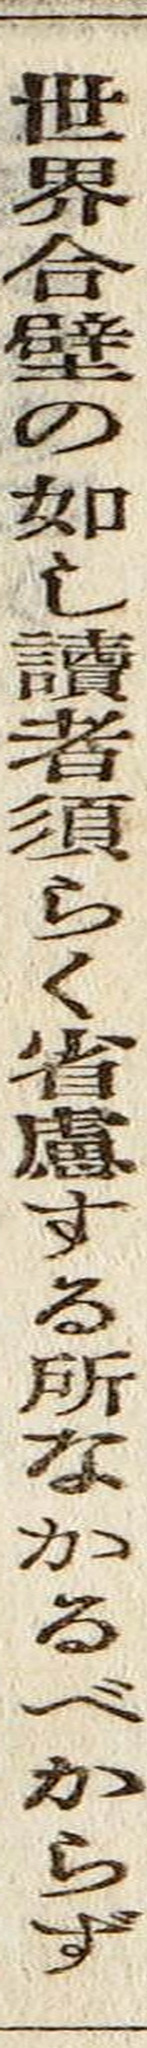世界合壁の如し読者須らく省慮する所なかるべからず
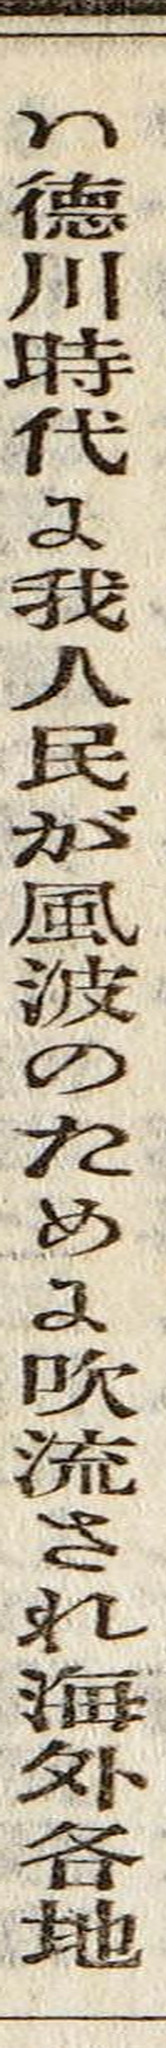は徳川時代に我人民が風波のために吹流され海外各地
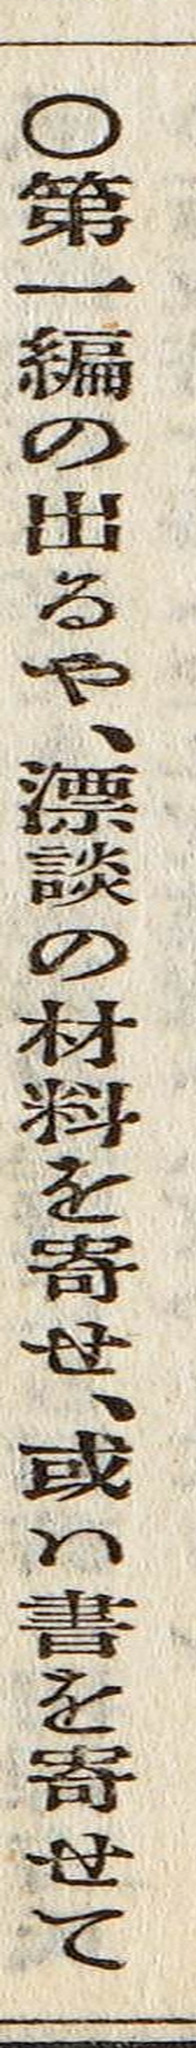◯第一編の出るや、漂談の材料を寄せ、或は書を寄せて
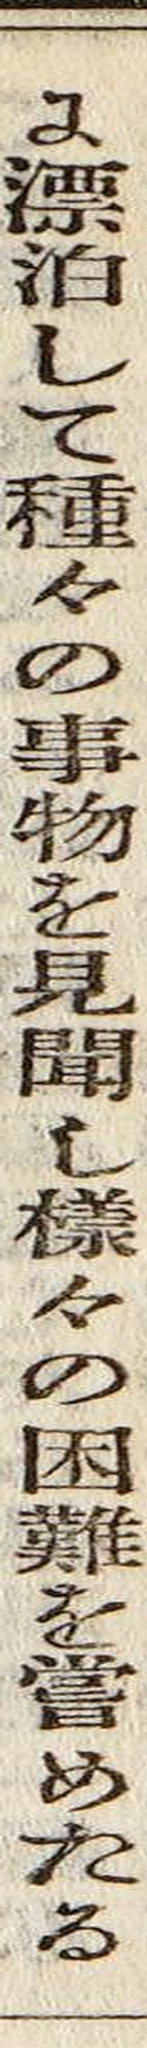に漂泊して種々の事物を見聞し様々の困難を嘗めたる
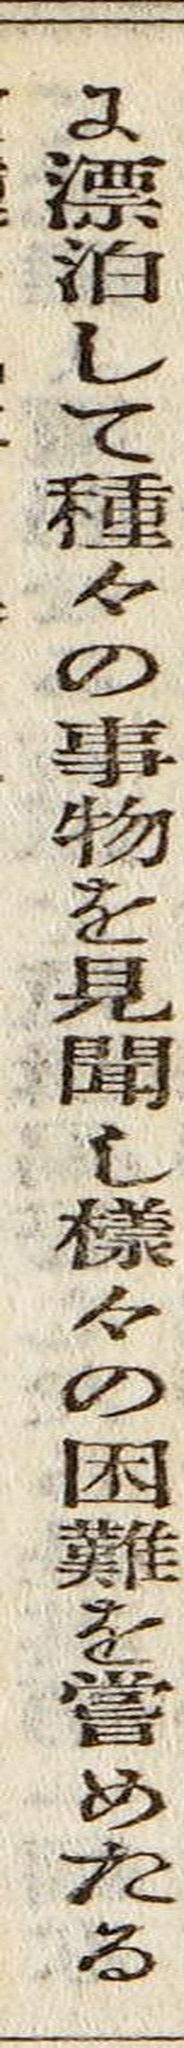に漂泊して種々の事物を見聞し様々の困難を嘗めたる
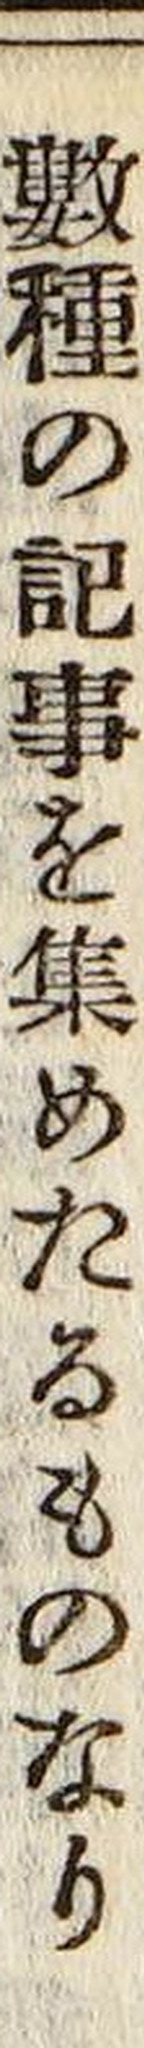数種の記事を集めたものなり
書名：日本漂流譚
